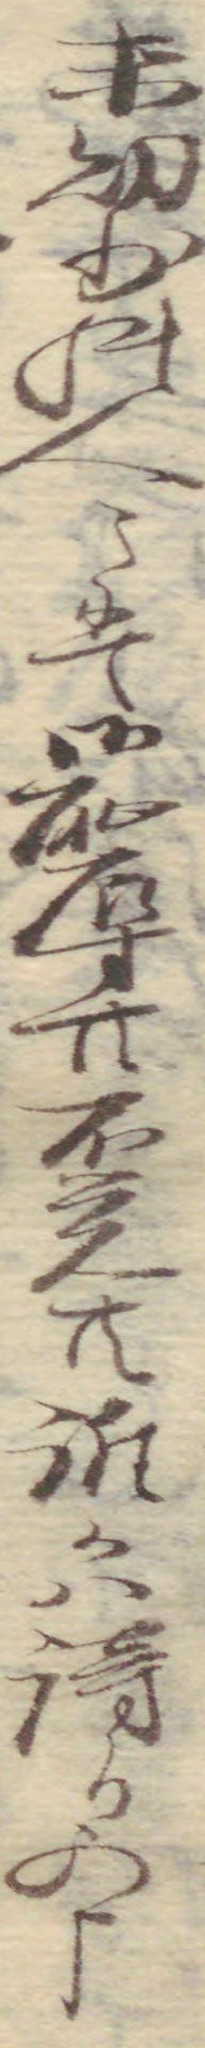未幼少の人々にて御恥辱共不覚共誰かは謗り可申
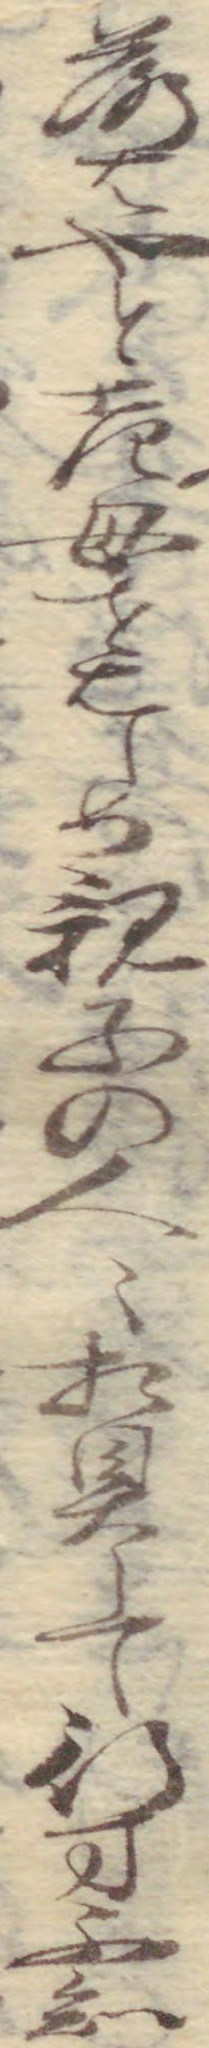落はやと老母をはしめ親子の人々相具して行方不知
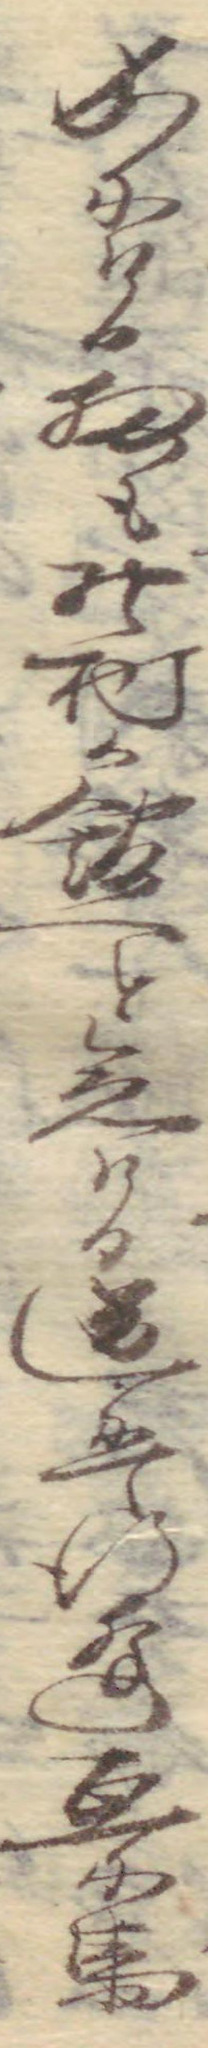成にける扨も野村か館へと急ける道にて行逢互に馬
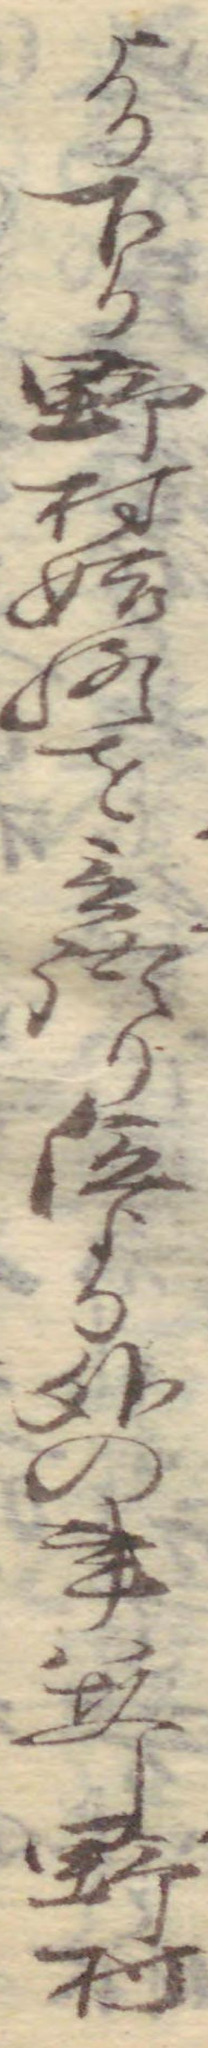より下り野村始終を言語り泣より外の事はなし野村
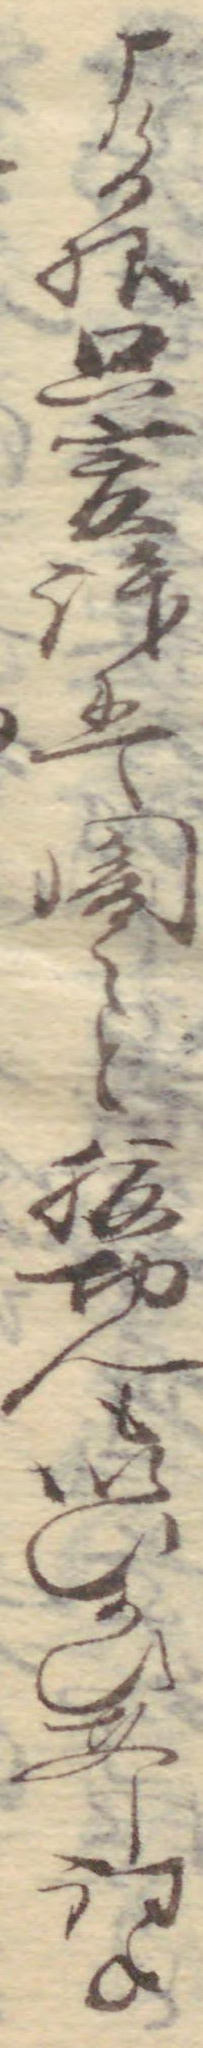申ける様只爰許にて闇々と腹切んもいひかひなし討手
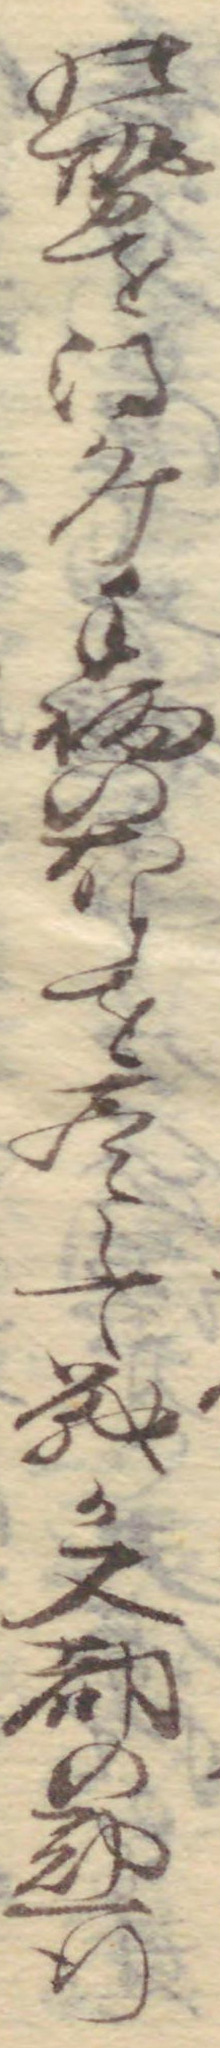の勢を待かけ手柄のほとを尽して戦か又都の郡一行
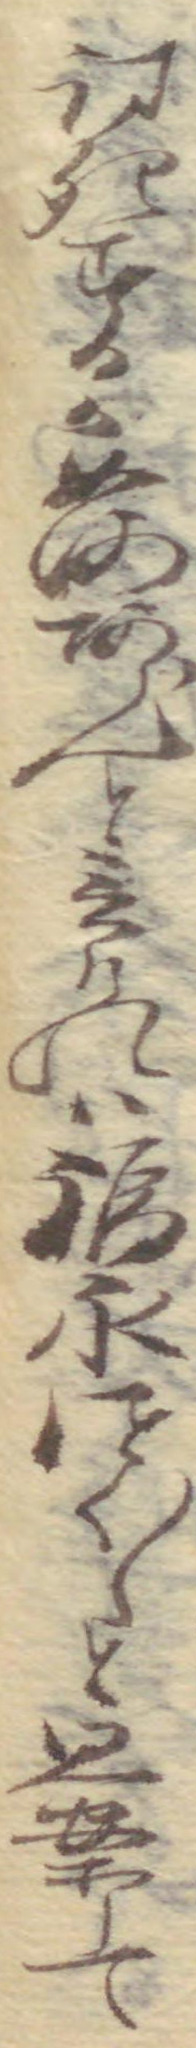討死するか如何あらんと言けれは福永つく〳〵と思案して
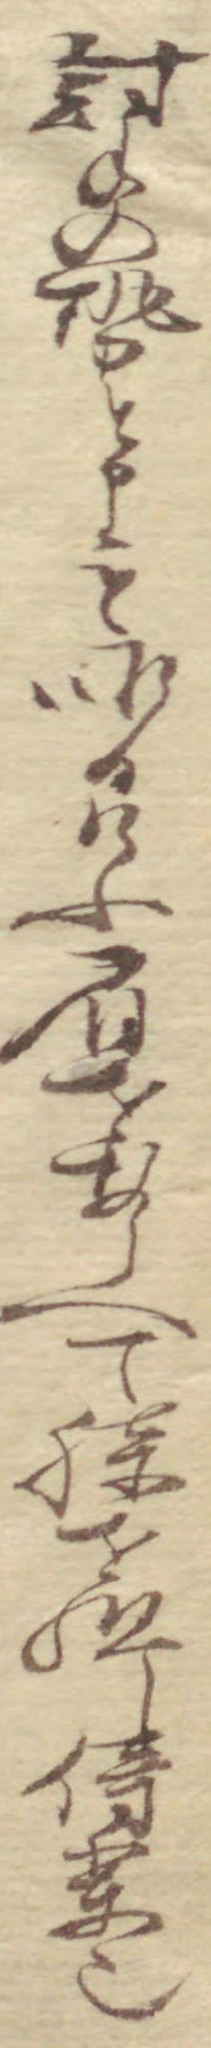討手の勢と申すも昨日けふ肩をならへて膝を組し傍輩也
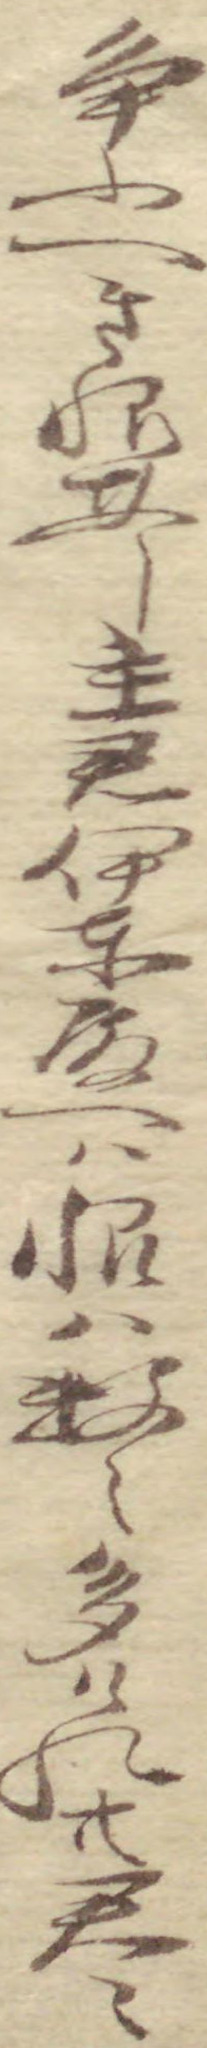争ふへき恨なし主君伊東殿へは恨は数々多けれ共君々
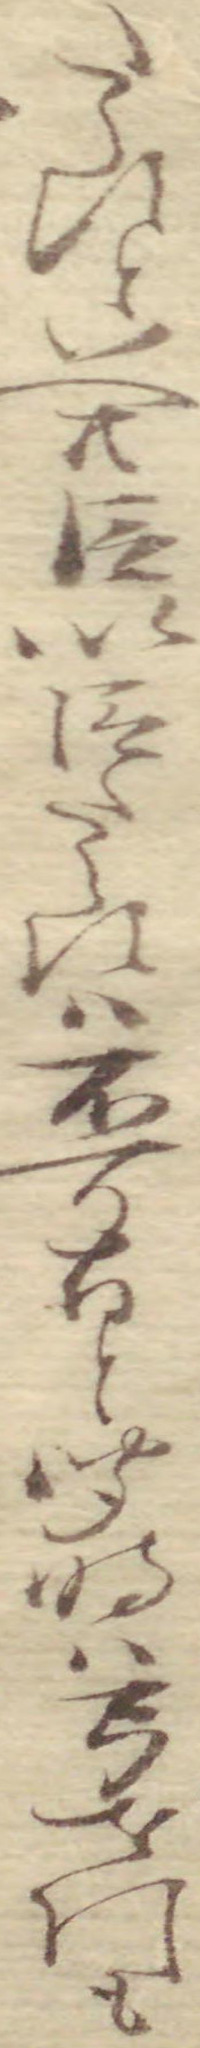たらすといへ共臣以臣たらすは不可有と聞時は弓を引も
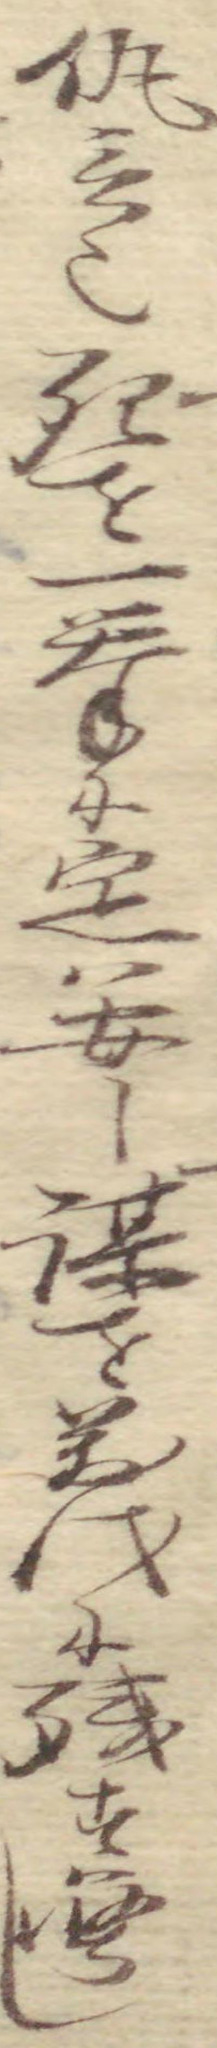仇言也死を一挙に定は安し謀を萬代に残すは怪し
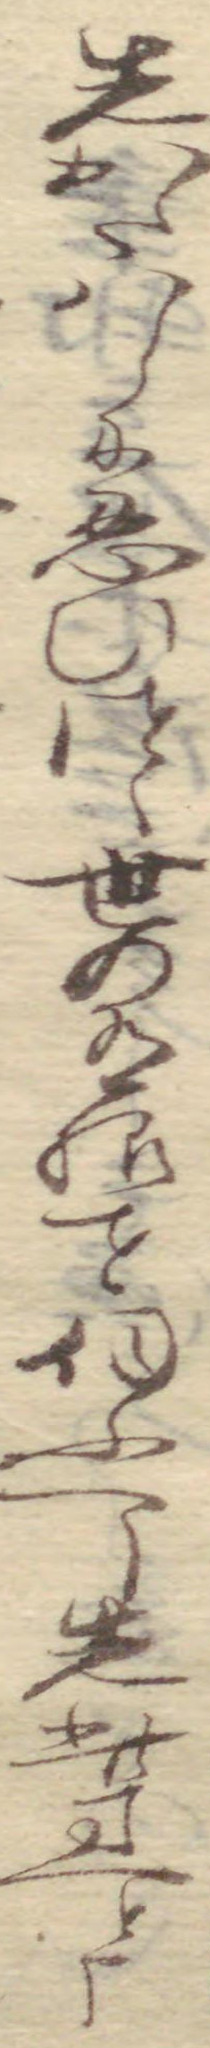先かたはらに忍ひつゝ世の有様を伺ふへし先此方へと申
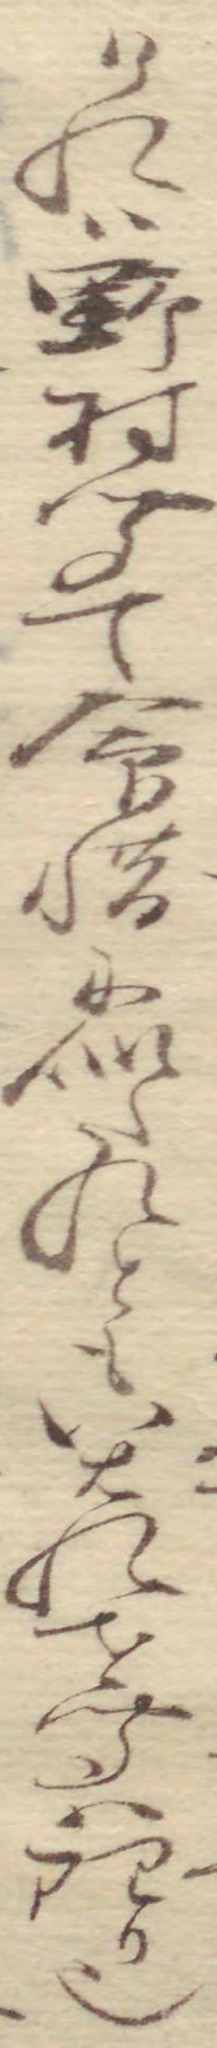けれは野村聞て命惜に似たれともいはれを聞は理り也
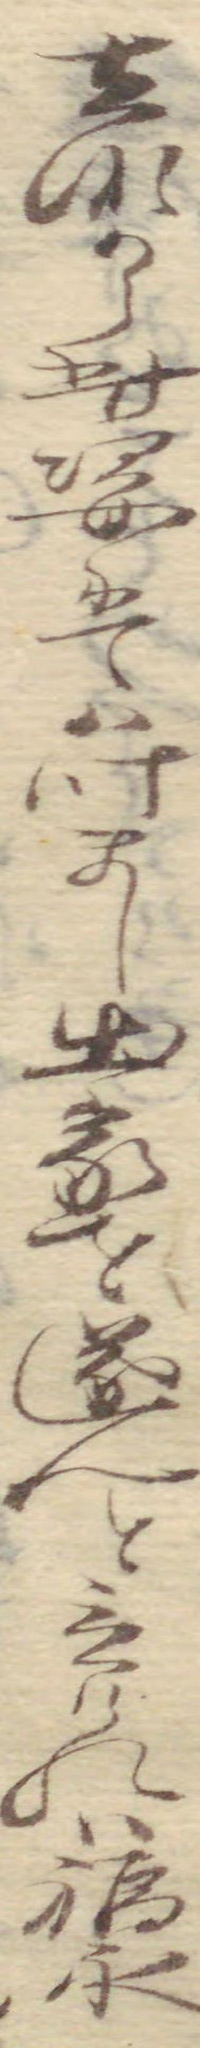去なから此姿にては叶まし出家を遂んと言けれは福永
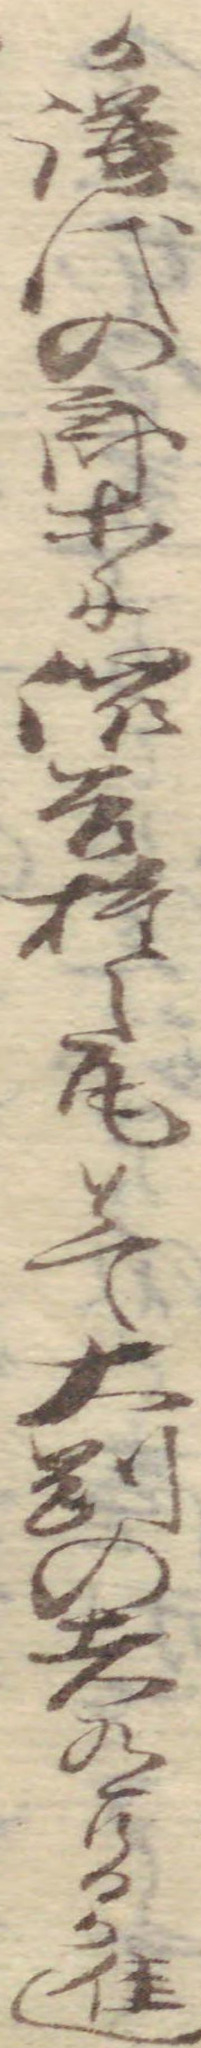か譜代の郎等に渋谷権之尾とて大剛の者有けるか進
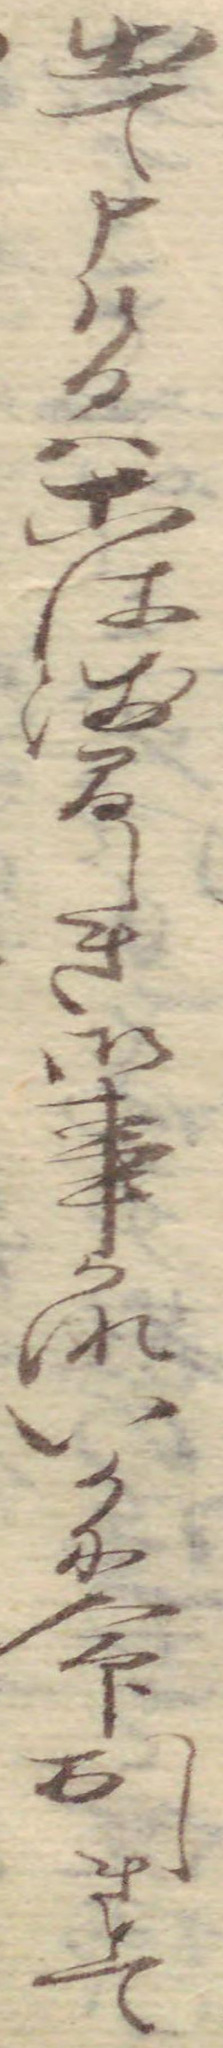出て申けるはこは浅間しき御事かないかに命おしきとて
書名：鶯宿雑記. 巻199-200
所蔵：国立国会図書館 National Diet Library, JAPAN
